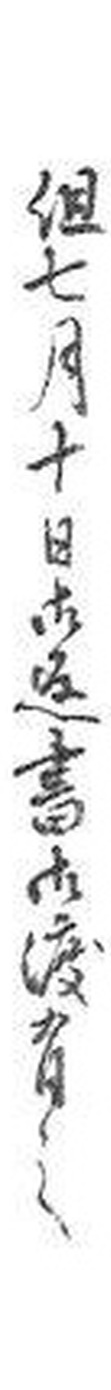但七月十日御返書御渡有之
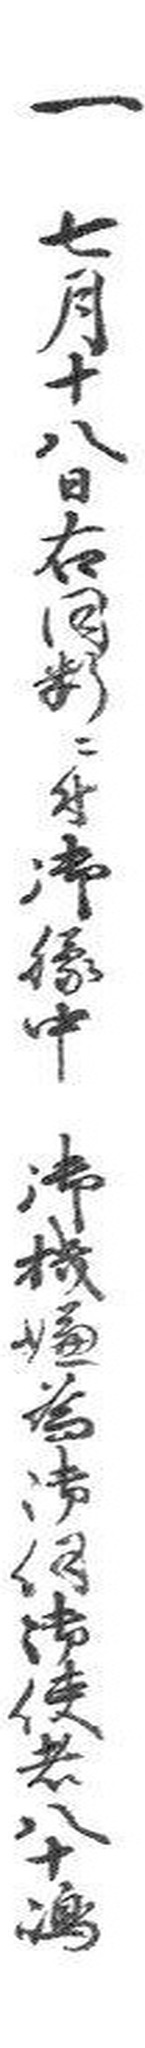一七月十八日右同断ニ付御朦中御機嫌為御伺御御使者八十嶋
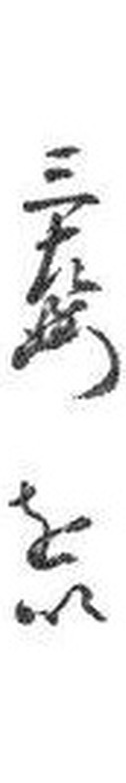三左衛門を以
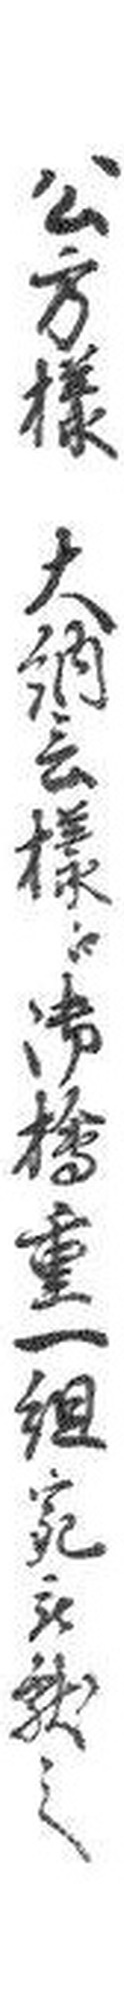公方様大納言様江御檜重一組宛被献之
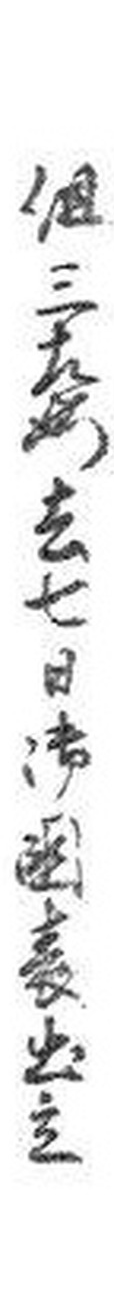但三左衛門去七日御国表出立
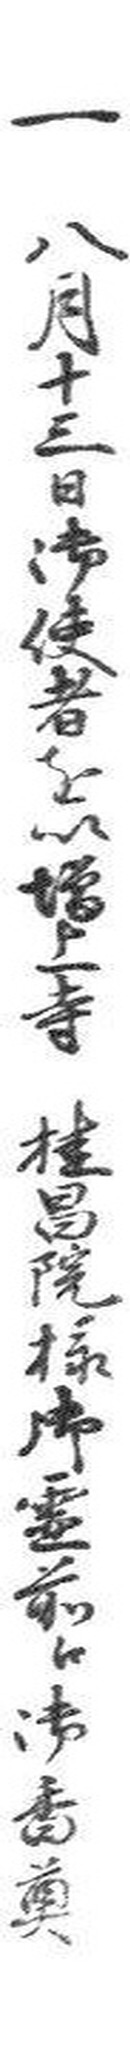一八月十三日御使者を以増上寺桂昌院様御霊前江御香奠
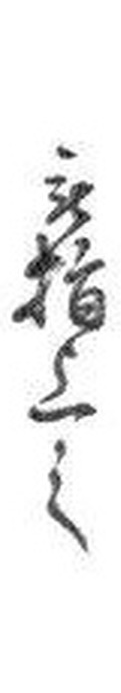被指上之
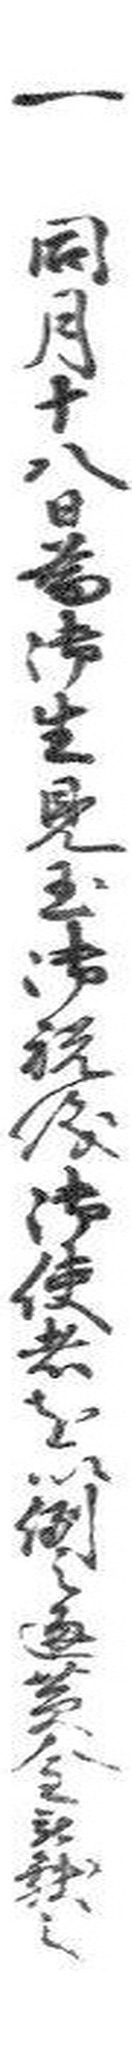一同月十八日為御生見玉御祝儀御使者を以例之通黄金被献之
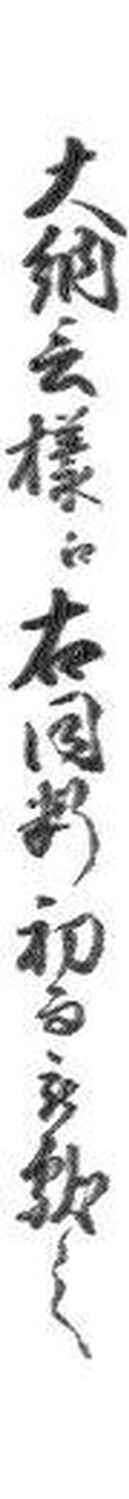大納言様江右同断初而被献之
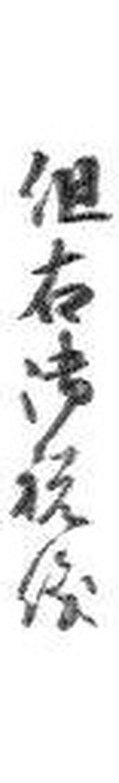但右御祝儀
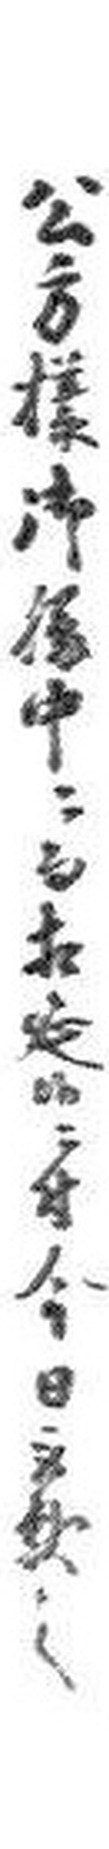公方様御朦中ニ而相延候ニ付今日被献之
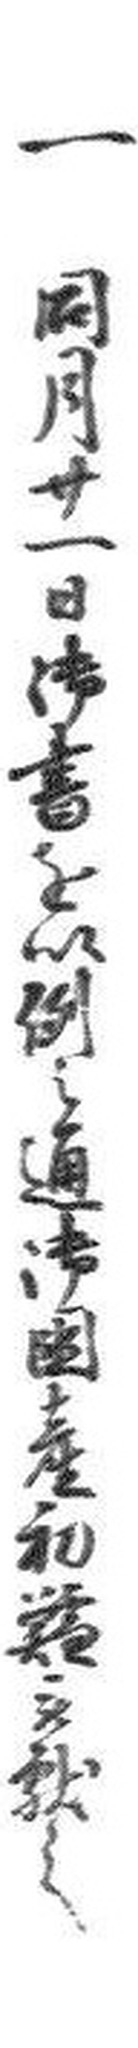一同月廿一日御書を以例之通御国産初鱈被献之
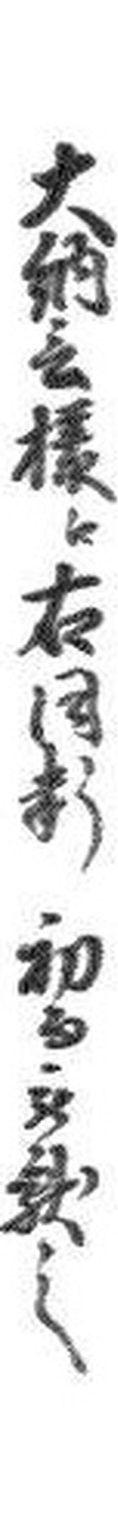大納言様江右同断初而被献之
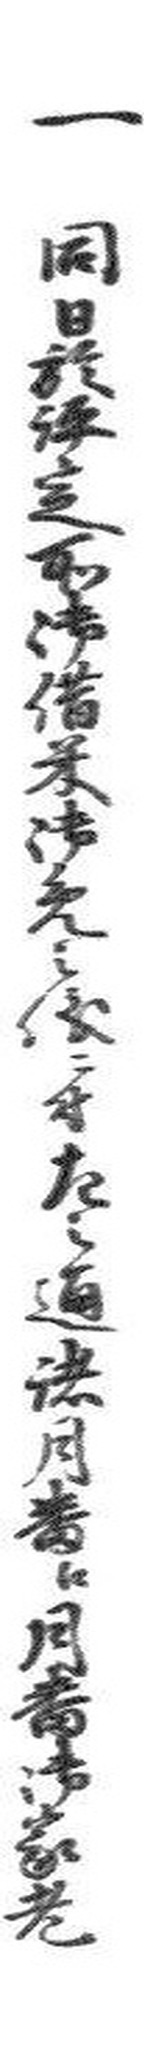一同日於評定所御借米御免之儀ニ付左之通諸月番江月番御家老
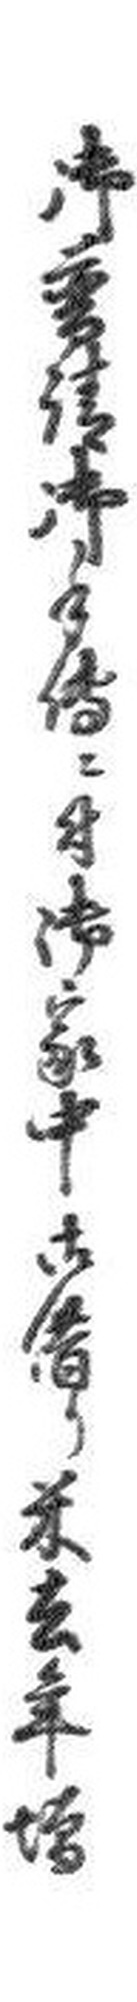御普請御手伝ニ付御家中御借り米去年増
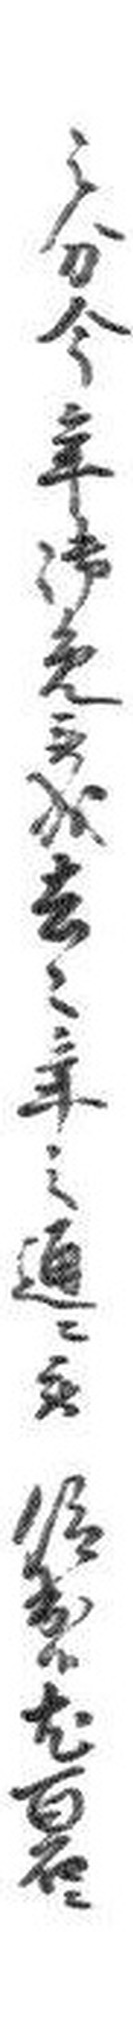之分今年御免被成去々年之通ニ被仰出候尤百石ニ
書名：家譜 二十三 吉品公 従宝永元年到同二年
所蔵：福井県文書館 Fukui Prefectural Archives
